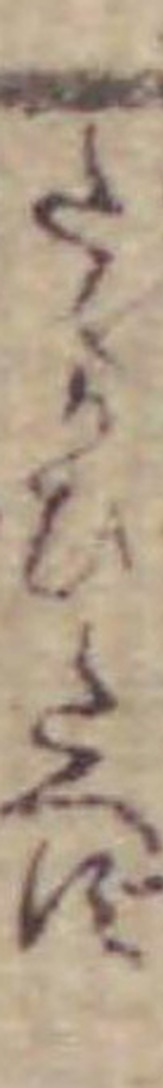たゝかひたへず
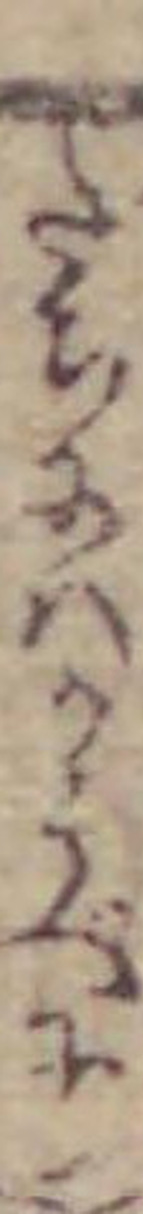たちにはかうべに
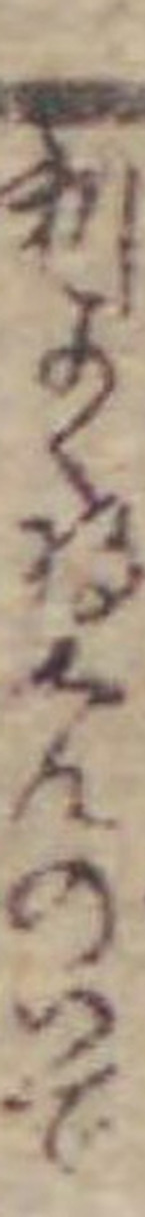利よく将くんのいで
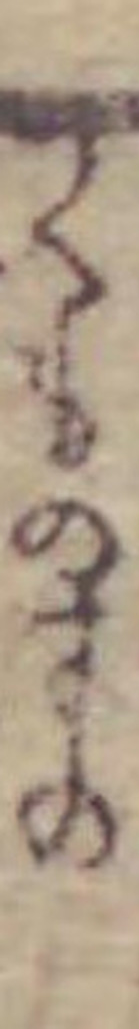くものすの
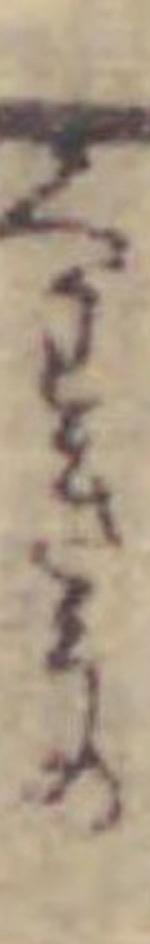くわきうの
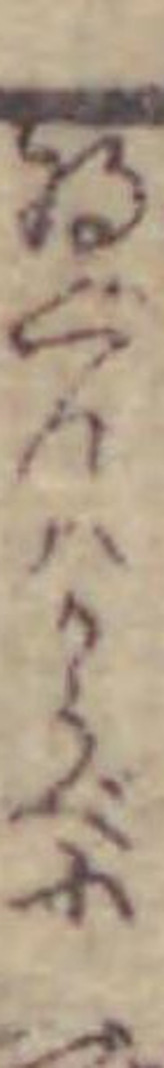将ぐんはかうべに
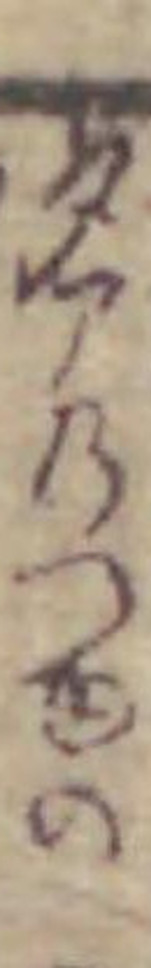夕へのつゆの
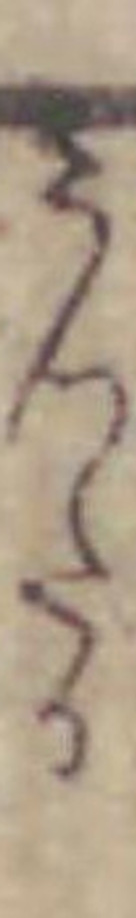うつたる
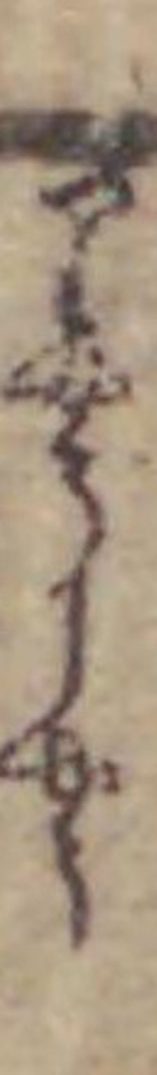りやうしやう
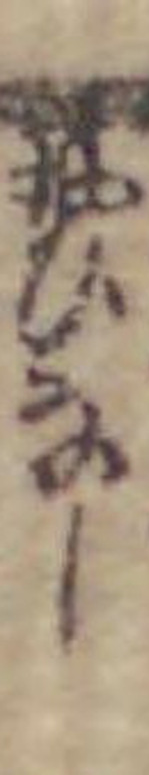おひなし
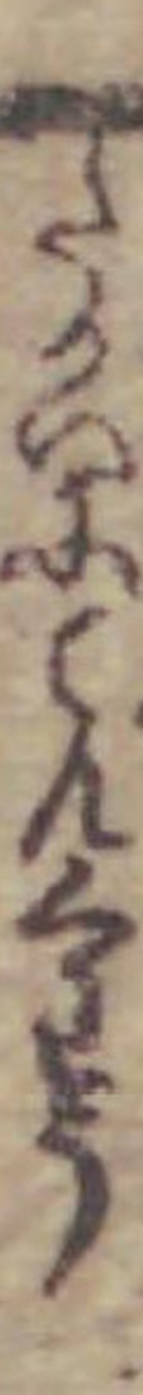たかいにてんくわう
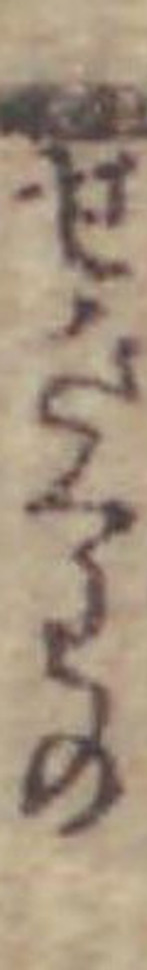せきくわの
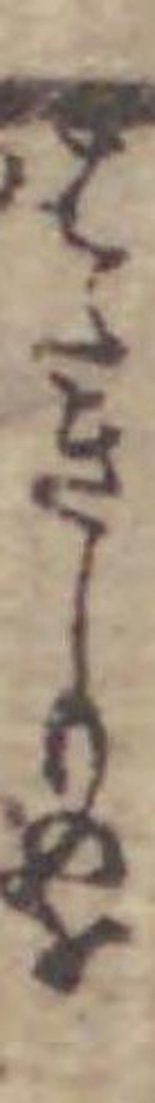はたきしものを
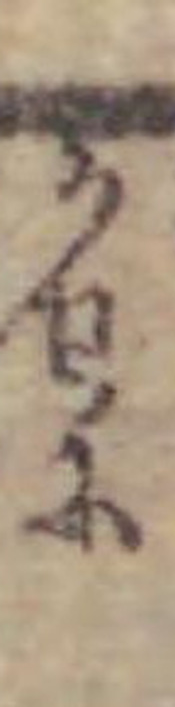かせに
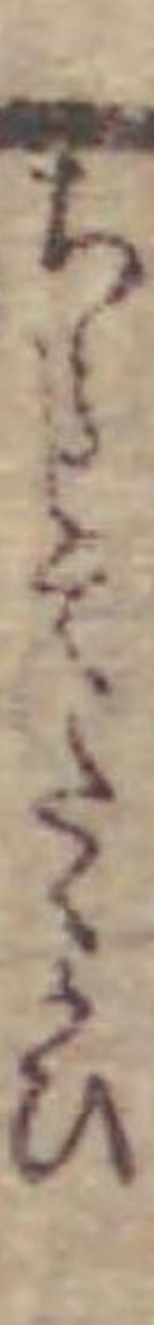ちらしてたゝかひ
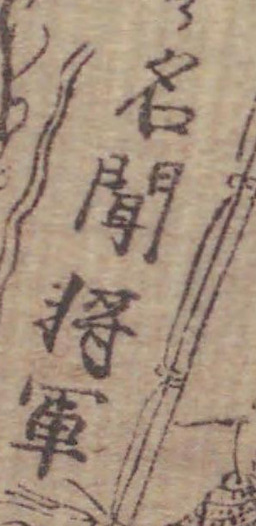名聞将軍
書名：和荘兵衛後日話 : 3巻
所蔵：国立国会図書館 National Diet Library, JAPAN
